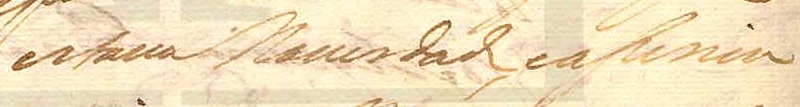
estaua Na uerdade, e assinou
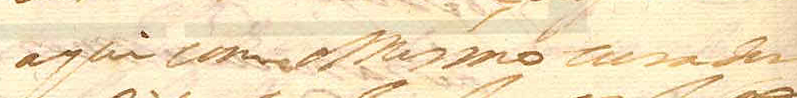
aqui com o Mesmo curador
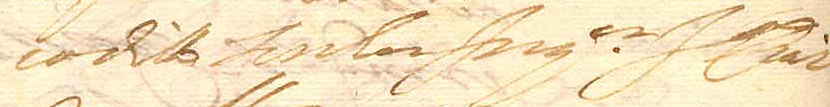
e o dito senhor Jnq.or J Diaz
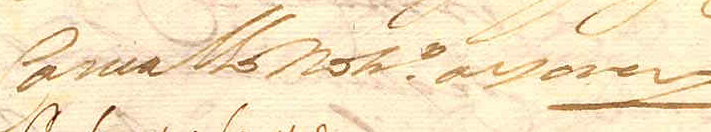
Carualho notr.o o escreuj
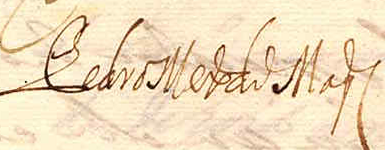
Pedro Mexe de Mage
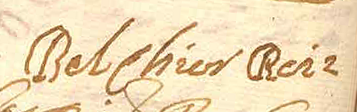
BelChior Roiz
